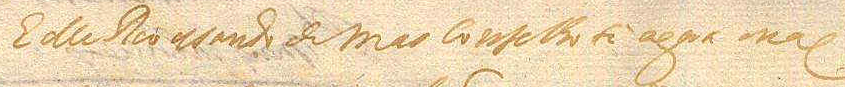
E elle Reo usando de mao conselho te agora naõ
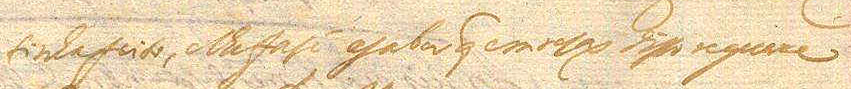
tinha feito, e lhe fasē a saber q̄ em resaõ disso requere
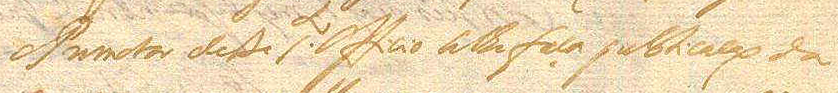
o Promotor deste S.to Officio E lhe faça publicaçaõ da
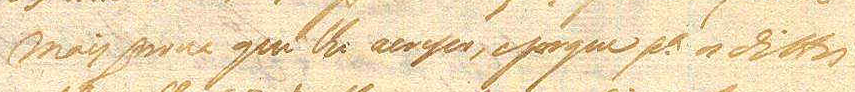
mais proua que lhe acreser, e porque p.a os dittos
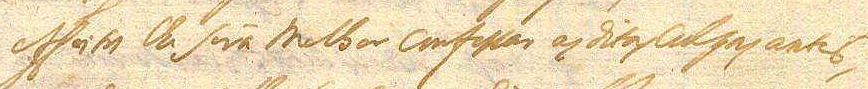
effeitos lhe será melhor confessar as ditas culpas antes,
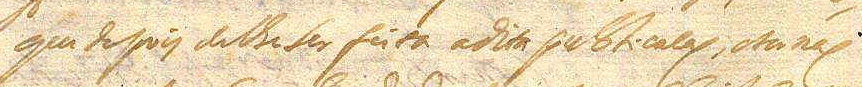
que depois de lhe ser feita a dita publicaçaõ, o tornaõ
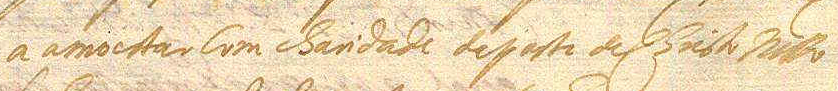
a amoestar com charidade da parte de Christo nosso
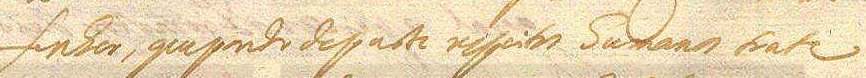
Senhor, que pondo de parte respeitos humanos trate
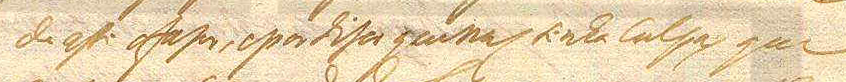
de assi o faser, e por diser que naõ tinha culpas que
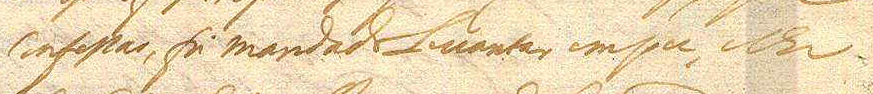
confessar, foi mandado Leuantar em pee, e lhe
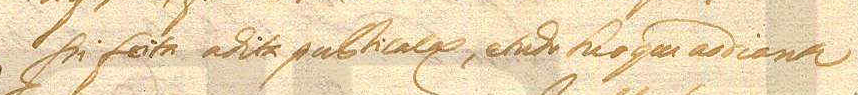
foi feita a dita publicaçaõ, e tudo he o que ao diante
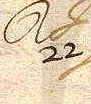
R 22
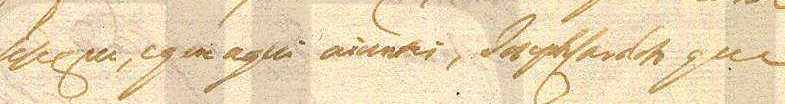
se segue, e que aqui asinei, Ioseph Cardoso que
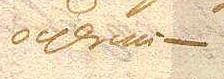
o escreui -
